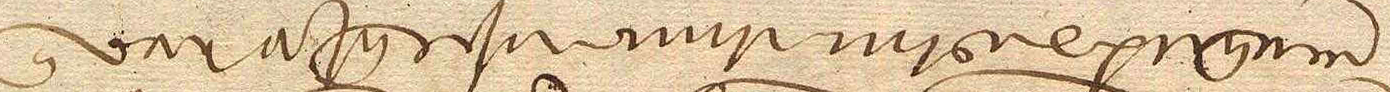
q̄ vay a JgreJa ouujr mjsa e pregacā
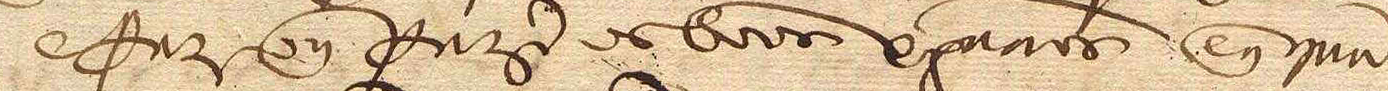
e faz o q̄ fazē os bōos xpãaos e q̄ quā
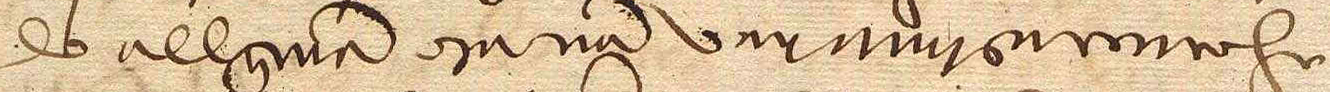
do allguuā ora nā vay a mjsa como he
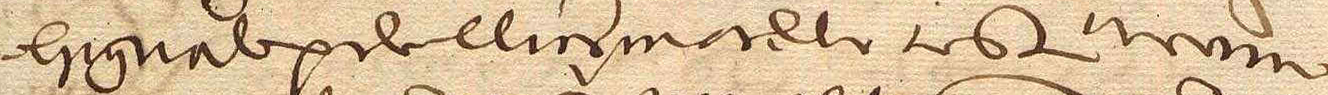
obriguado pede lliçēca a elle testa como
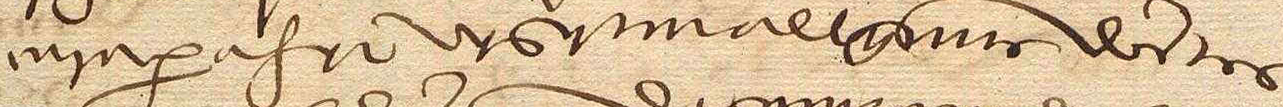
cura ꝑa hyr vysytar allgūus doētes
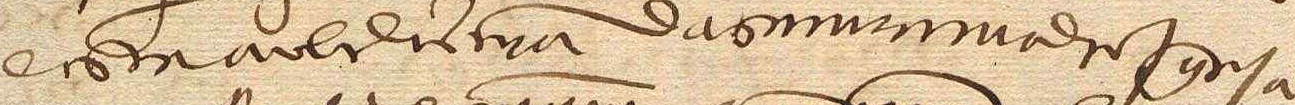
e esta a obediēcya da samta madre JgreJa
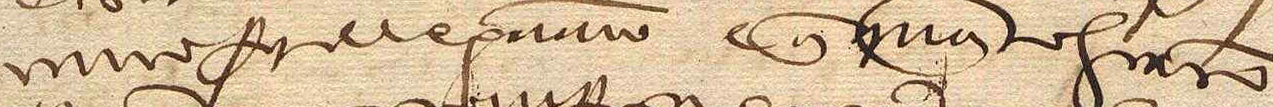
como fyell xpãaoo e q̄ quāto he a c̄o
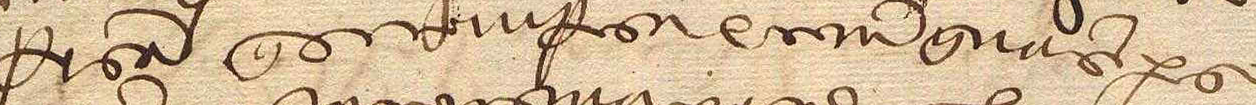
fysā q̄ se comfesa e comūgua sēꝑ so
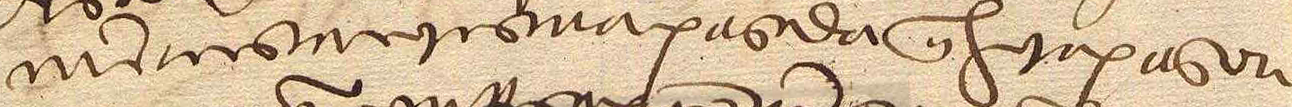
mēte esta coresma pasada q̄ hora pasou
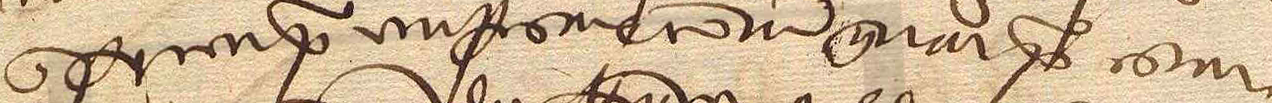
q̄ fycou p̄o confesar e c̄omūguar p̄o estar
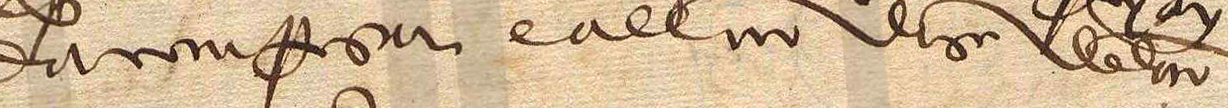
da comfesar e all n̄o dise do dyto
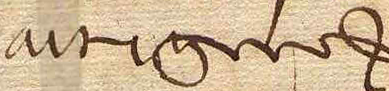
artyguo
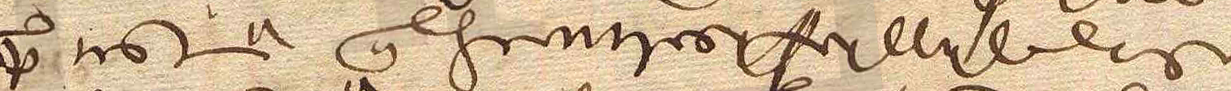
p̄o testa q̄ lhe outrosy foy llydo dise
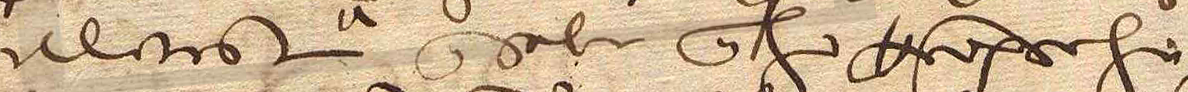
elle testa q̄ sabe q̄ ho Reo p̄so he
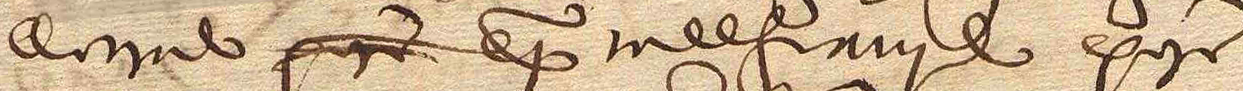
lletrado porē e p̄o tall he aujdo e porē
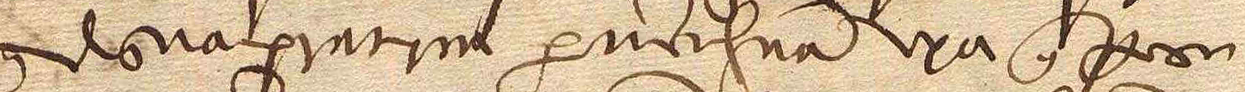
q̄ de sua pratyca ꝑ nenhuā vya q̄ fose
